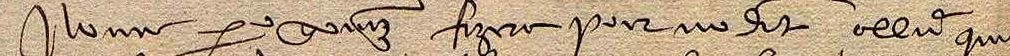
Nome ꝑo gomez fizera poer no dito allua que
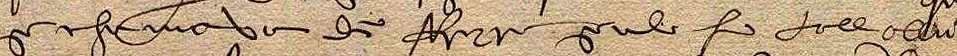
se chamava do ffreyre sendo ho tall allua
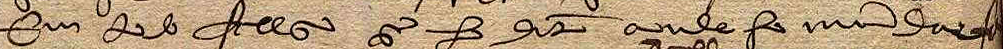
Em todo fallso sē ho dito conde ho mādar fa
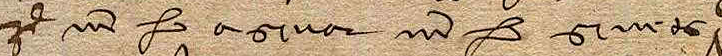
zer nē ho asynar nē ho synete
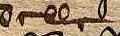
delle
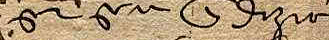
ser seu q̄ dizia
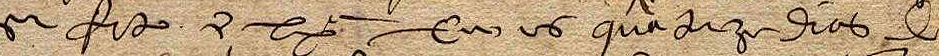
ser feyto ē lxa Em os quatorze dias de
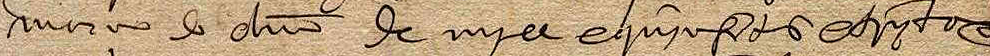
março do Anō de mjll e qujnhētos e trȳta e
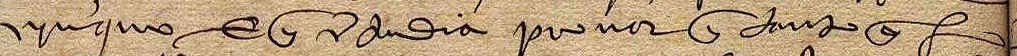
cynquo E q̄ ētendia prouar q̄ tanto q̄ ho
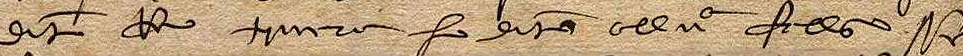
dito Reo tiuera ho dito allua fallso sse
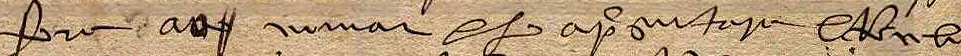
fora aa çumar e ho ap̄sentara e Recebe
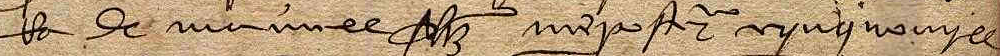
Ra de manuell ffr̄rz mēposteyro cynquo mjll
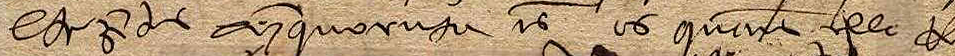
e trezētos e cȳquoenta r̄s os quaes elle Re
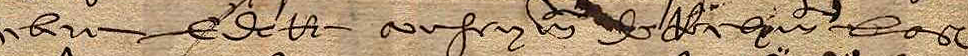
cebera E deRa conhecymto do Recebymto e asy
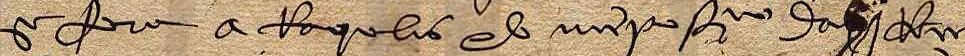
se fora a Rayolos e do mēpostero dahj Rece
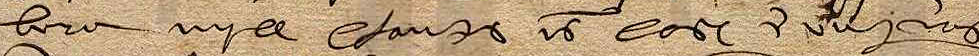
bera mjll e tantos r̄s e asy ē outras
